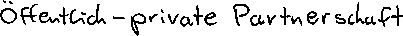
Öffentlich-private Partnerschaft
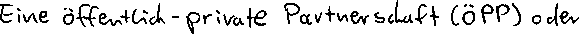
Eine öffentlich-private Partnerschaft (ÖPP) oder
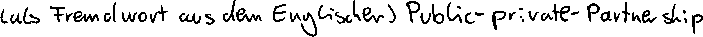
(als Fremdwort aus dem Englischen) Public-private-Partnership
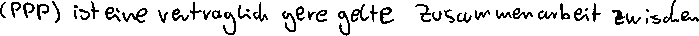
(PPP) ist eine vertraglich geregelte Zusammenarbeit zwischen
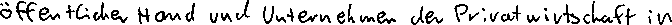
öffentlicher Hand und Unternehmen der Privatwirtschaft in
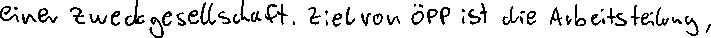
einer Zweckgesellschaft. Ziel von ÖPP ist die Arbeitsteilung,
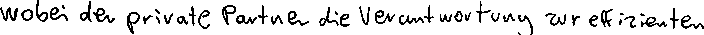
wobei der private Partner die Verantwortung zur effizienten
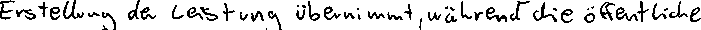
Erstellung der Leistung übernimmt, während die öffentliche
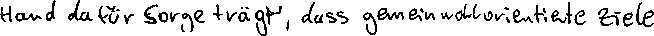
Hand dafür Sorge trägt, dass gemeinwohlorientierte Ziele
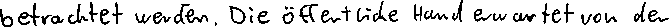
beachtet werden. Die öffentliche Hand erwartet von der
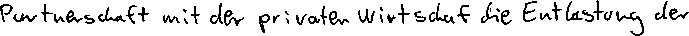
Partnerschaft mit der privaten Wirtschaft die Entlastung der
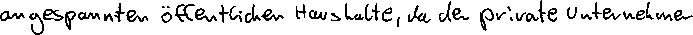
angespannten öffentlichen Haushalte, da der private Unternehmer
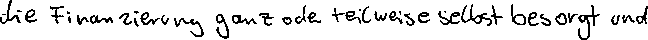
die Finanzierung ganz oder teilweise selbst besorgt und
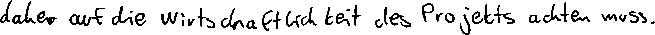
daher auf die Wirtschaftlichkeit des Projektes achten muss.
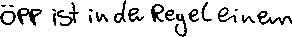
ÖPP ist in der Regel einem
